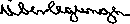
Überlegungen.
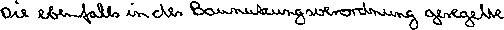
Die ebenfalls in der Baunutzungsverordnung geregelte
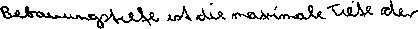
Bebauungstiefe ist die maximale Tiefe der
